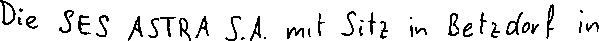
Die SES ASTRA S.A. mit Sitz in Betzdorf in
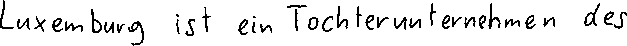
Luxemburg ist ein Tochterunternehmen des
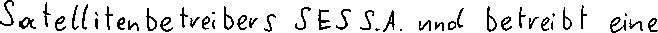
Satellitenbetreibers SES S.A. und betreibt eine
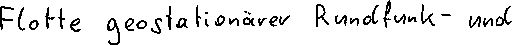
Flotte geostationärer Rundfunk- und
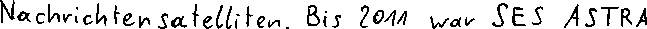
Nachrichtensatelliten. Bis 2011 war SES ASTRA
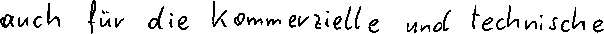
auch für die kommerzielle und technische
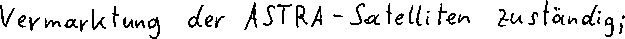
Vermarktung der ASTRA-Satelliten zuständig;
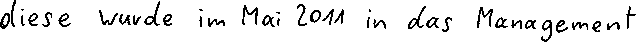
diese wurde im Mai 2011 in das Management
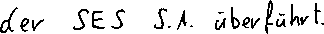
der SES S.A. überführt.
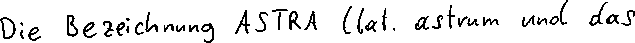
Die Bezeichnung ASTRA (lat. astrum und das
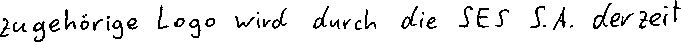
zugehörige Logo wird durch die SES S.A. derzeit
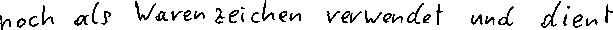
noch als Warenzeichen verwendet und dient
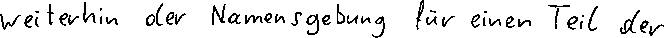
weiterhin der Namensgebung für einen Teil der
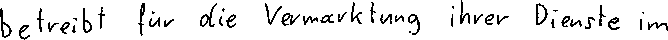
betreibt für die Vermarktung ihrer Dienste im
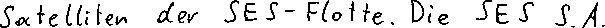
Satelliten der SES-Flotte. Die SES S.A.
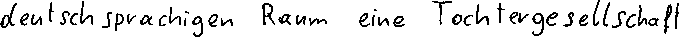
deutschsprachigen Raum eine Tochtergesellschaft
